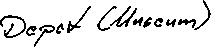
Depot (Museum)
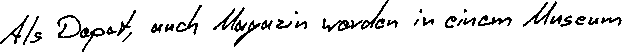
Als Depot, auch Magazin werden in einem Museum
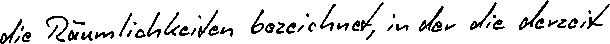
die Räumlichkeiten bezeichnet, in der die derzeit
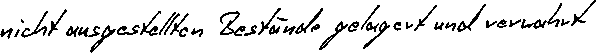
nicht ausgestellten Bestände gelagert und verwahrt
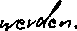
werden.
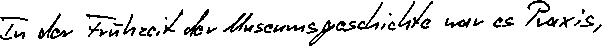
In der Frühzeit der Museumsgeschichte war es Praxis,
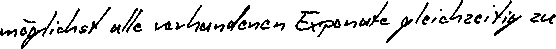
möglichst alle vorhandenen Exponate gleichzeitig zu
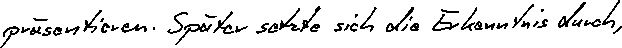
präsentieren. Später setzte sich die Erkenntnis durch,
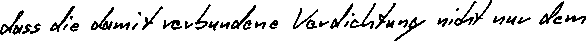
dass die damit verbundene Verdichtung nicht nur dem
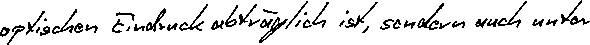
Optischen Eindruck abträglich ist, sondern auch unter
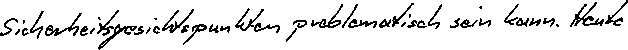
Sicherheitsgesichtspunkten problematisch sein kann. Heute
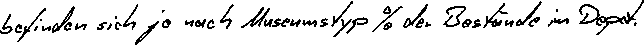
Befinden sich je nach Museumstyp % der Bestände im Depot.
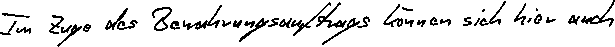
Im Zuge des Bewahrungsauftrags können sich hier auch
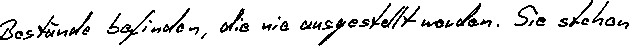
Bestände befinden, die nie ausgestellt werden. Sie stehen
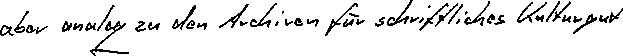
aber analog zu den Archiven für schriftliches Kulturgut
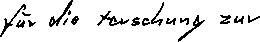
für die Forschung zur
